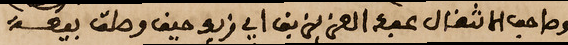وصاحب الاشغال عبد العزيز بن ابي زيد حين وصلت بيعة
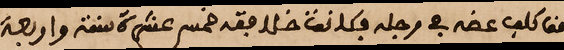من كلب عضه في رجله فكانت خلافته خمس عشرة سنة واربعة
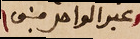عبد الواحد بن
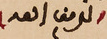لدين الله
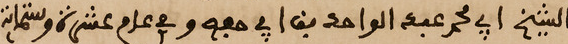الشيخ ابي محمد عبد الواحد بن ابي حفص وفي عام عشرة وستماية
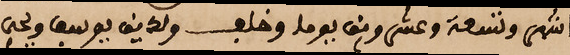اشهر وتسعة وعشرين يوما وخلف ولدين يوسف ويحيى
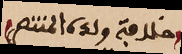خلافة ولده المنتصر
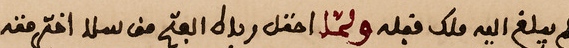لم يبلغ اليه ملك قبله ولما احتل رباط الفتح من سلا اخترمته
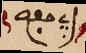ابي حفص
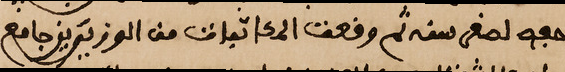حفص لصغر سنه ثم وقعت المكاتبات من الوزير بن جامع
